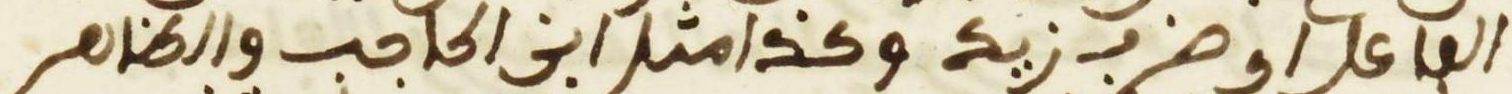الفاعل اي ضرب زيد و كذا مثل ابن الحاجب و الظاهر
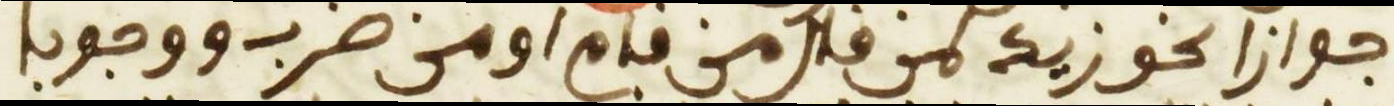جوازا نحو زيد لمن قال من قام او من ضرب بو وجوبا
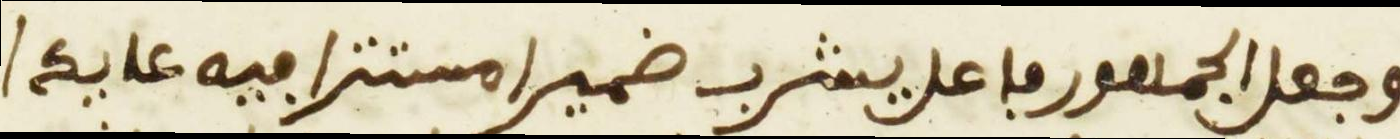و جعل الجمهور فاعل يشرب ضميرا مستتترا فيه عايدا
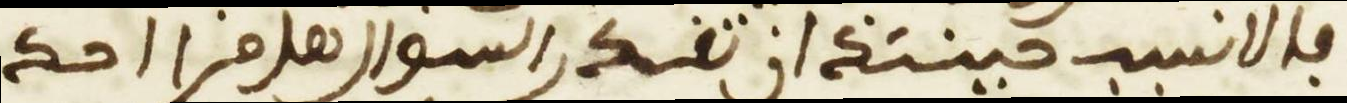فالانسب حينئذ ان تقدر السوال هل قرا احد
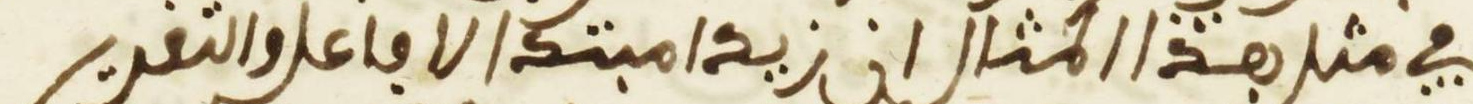في مثل هذا المثال ان زيدا مبتدا لا فاعل و التقرير
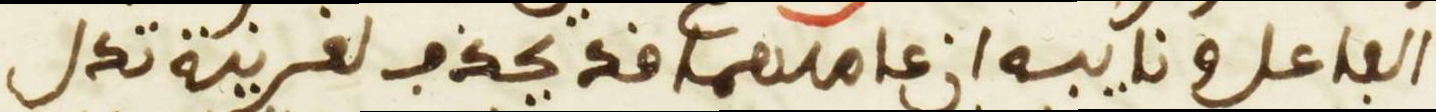الفاعل و نايبه ان عاملهما قد يحذف لقرينة تدل
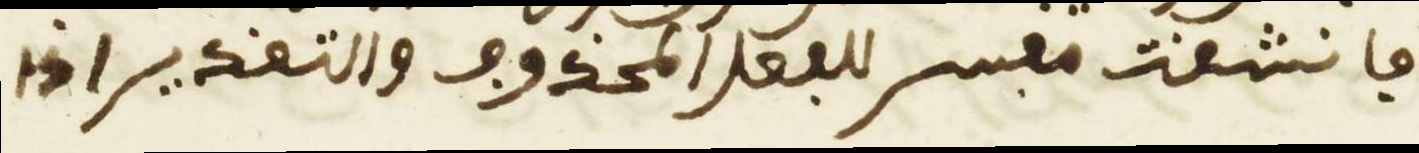فانشقت مفسر للفعل المحذوف و التقدير اذا
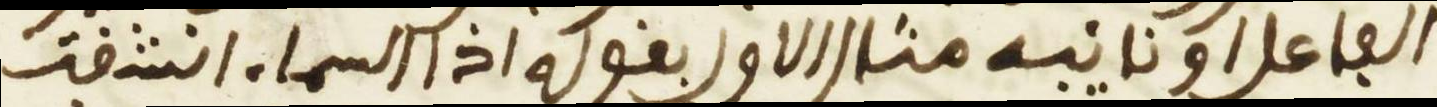الفاعل او نايبه مثال الاول بقوله اذا السماء انشقت
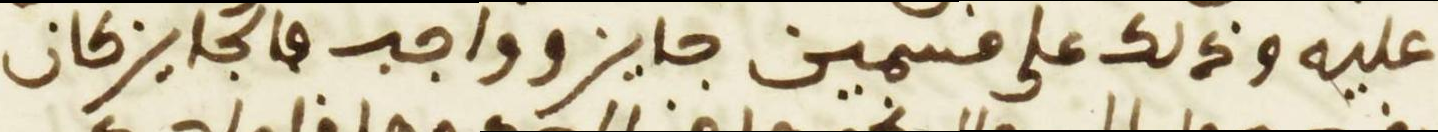عليه و ذلك قسمين جايز و واجب فالجايز كان
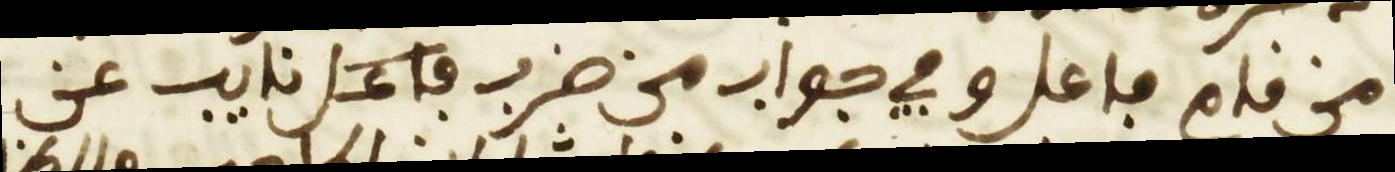من قام فاعل و في جواب من ضرب فاعل نايب عن
